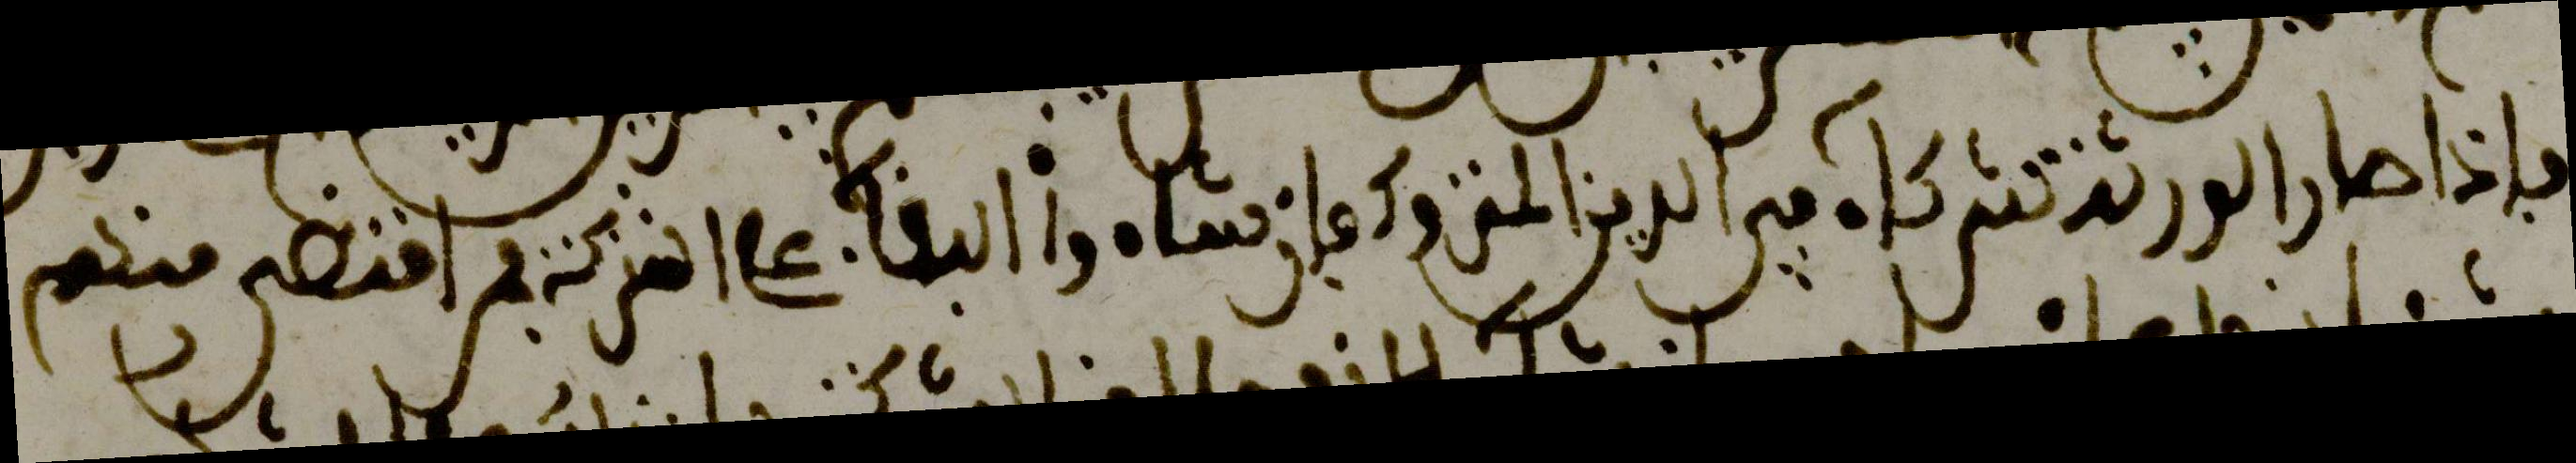فاذا صار الورثة شركاء في الدين المتروك فان شاءوا البقاء على الشركة فمن اقتضى منهم
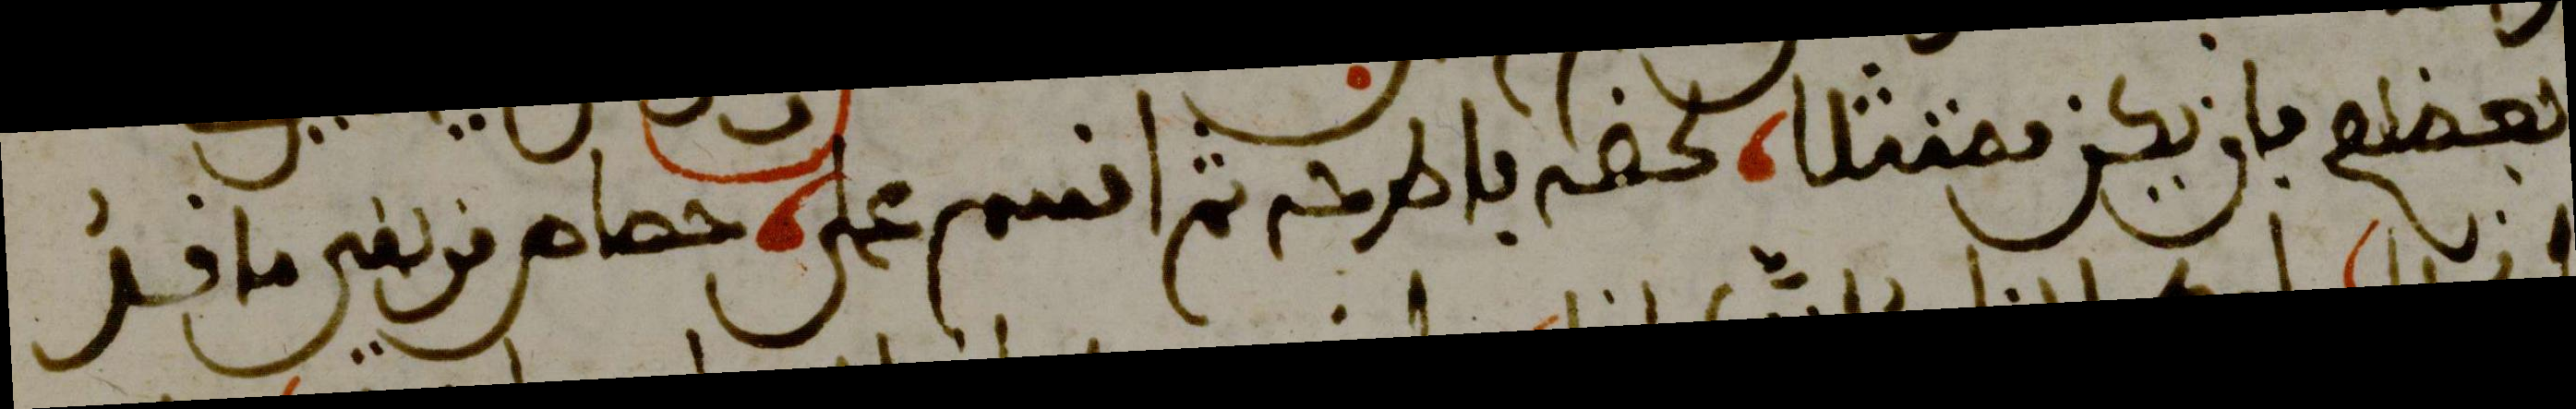بعضهم فان يكن ممتثلا لحضه فاطرحه ثم اقسم على حصاص من بقي ما قد
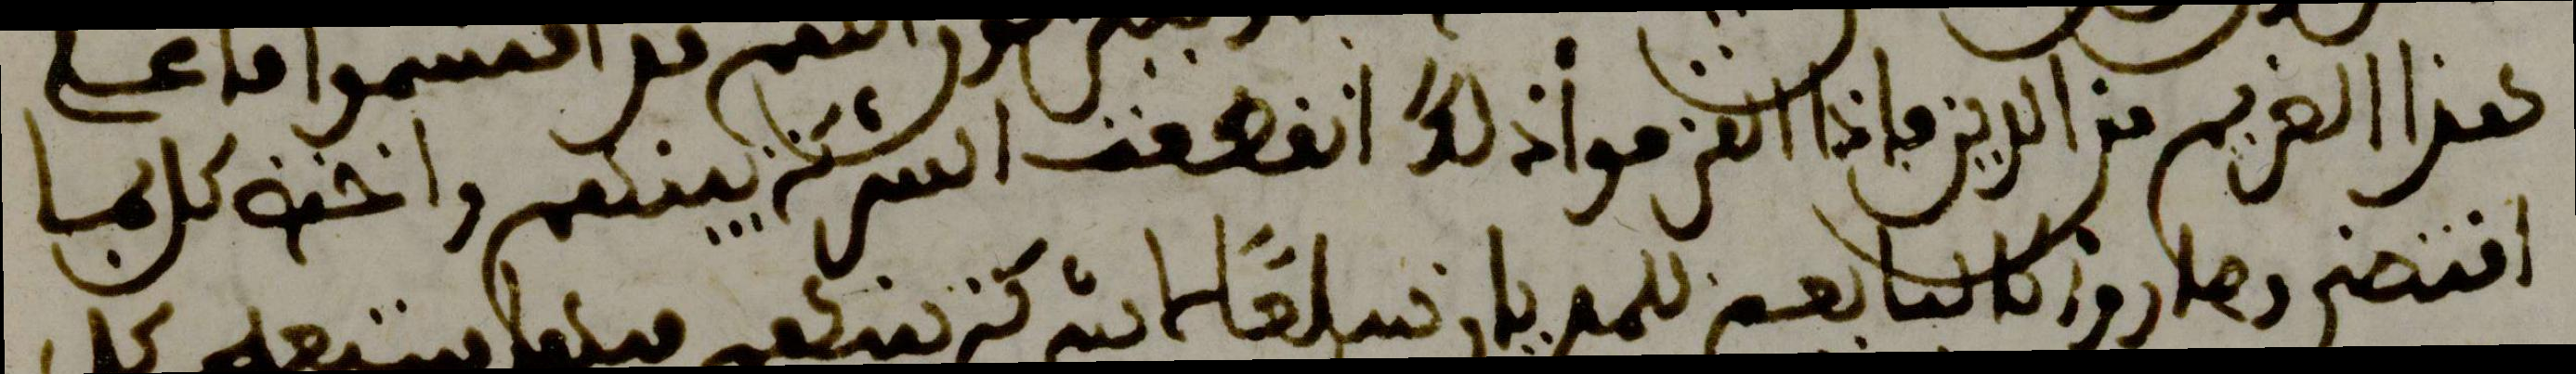هذا الغريم من الدين فاذا التزموا ذلك انقطعت الشركة بينهم واختص كل بما
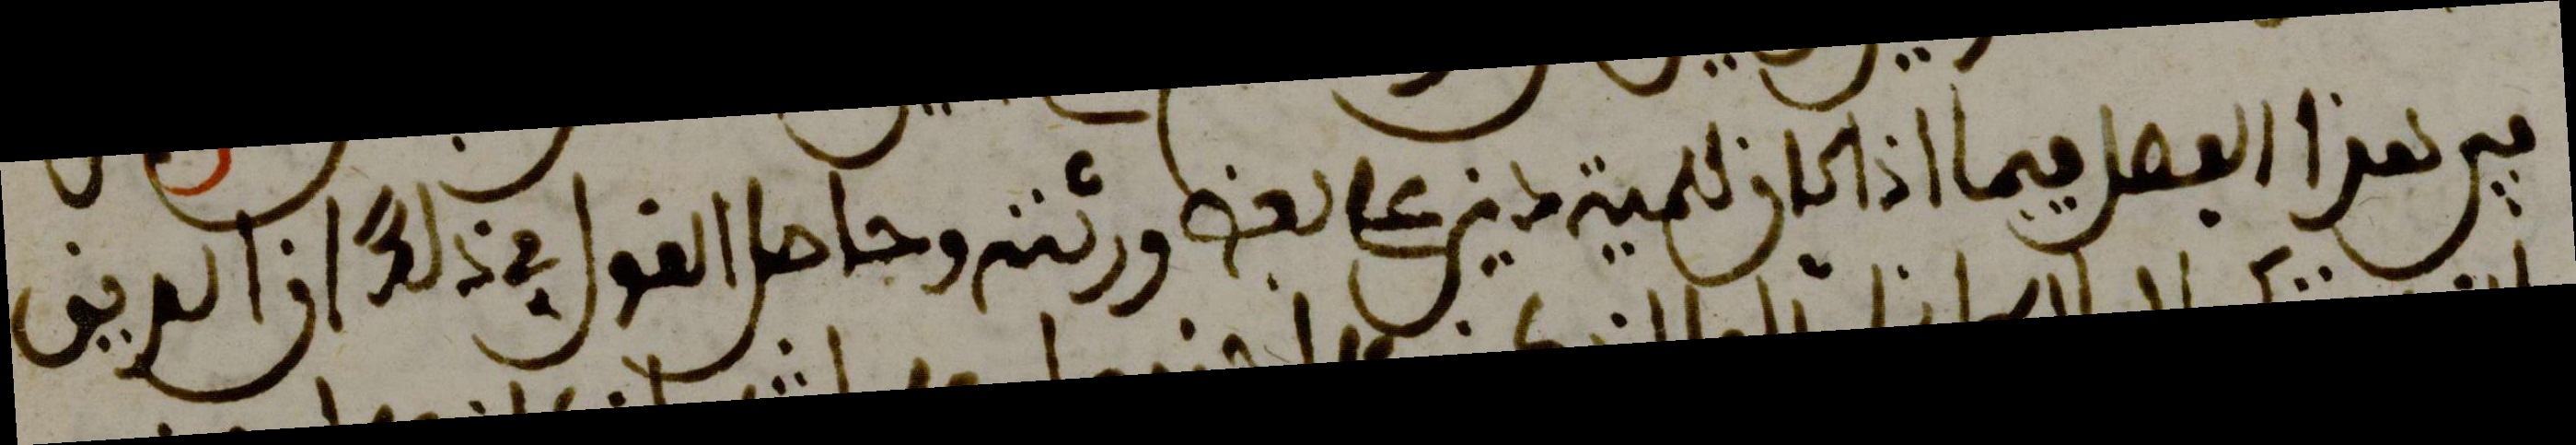في هذا الفصل فيما اذا كان للمية دين على بعض ورثته وحاصل القول في ذلك ان الدين
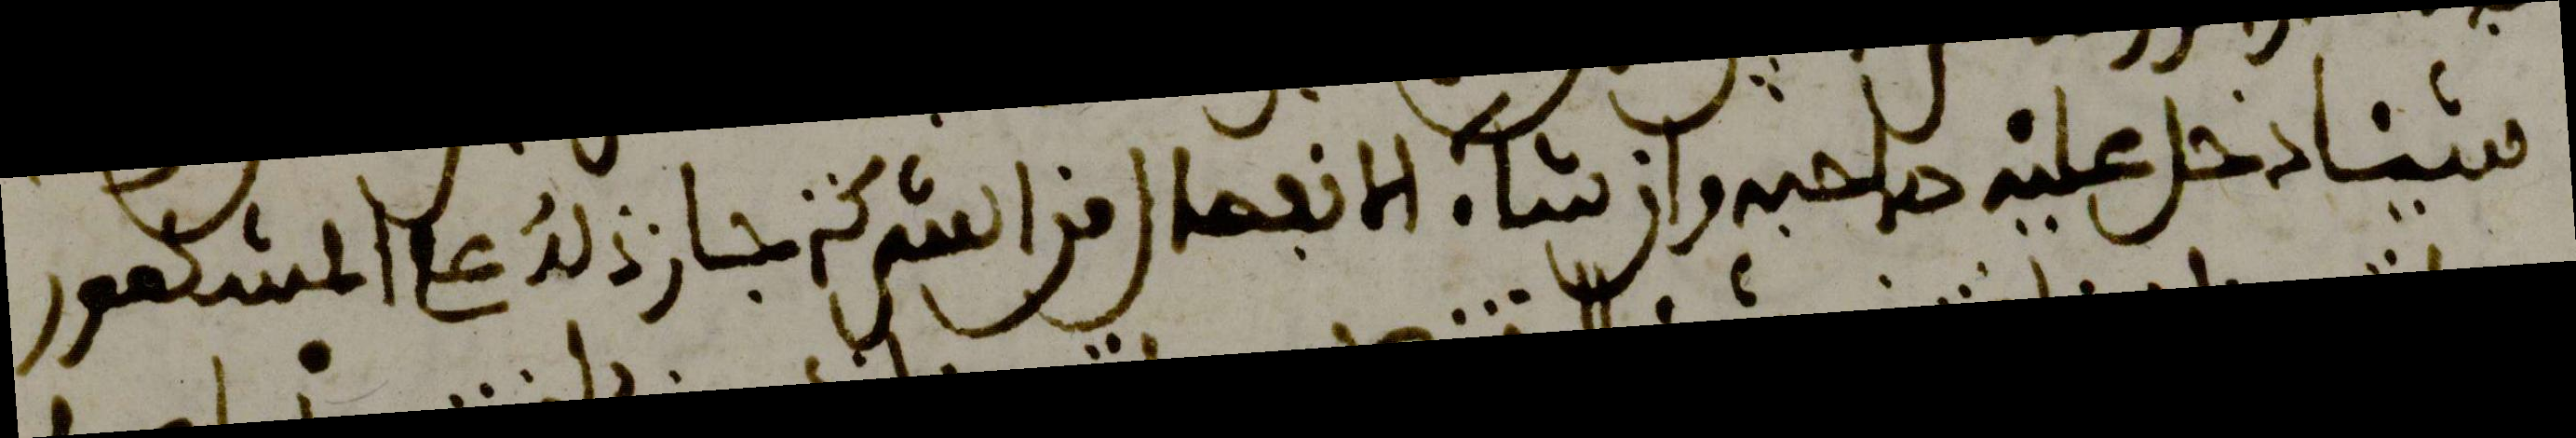شيئا دخل عليْه صاحبه وان شاء الانفصال من الشركة جاز ذلك على المشهور
